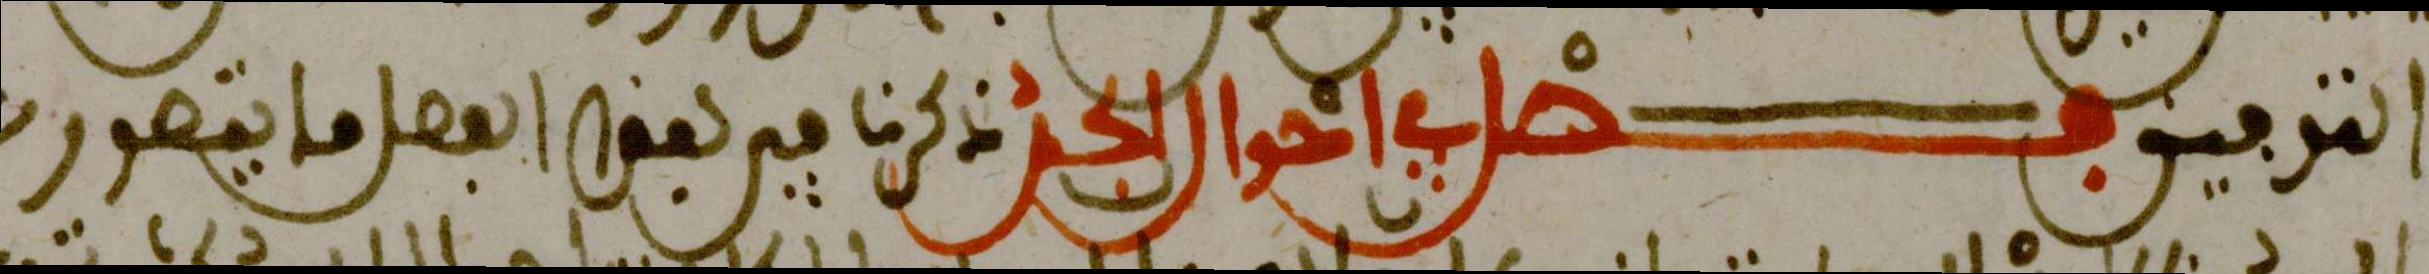التوفيق فَصْل في احْوال الجد ذكرن في هذا الفصل ما يتصور
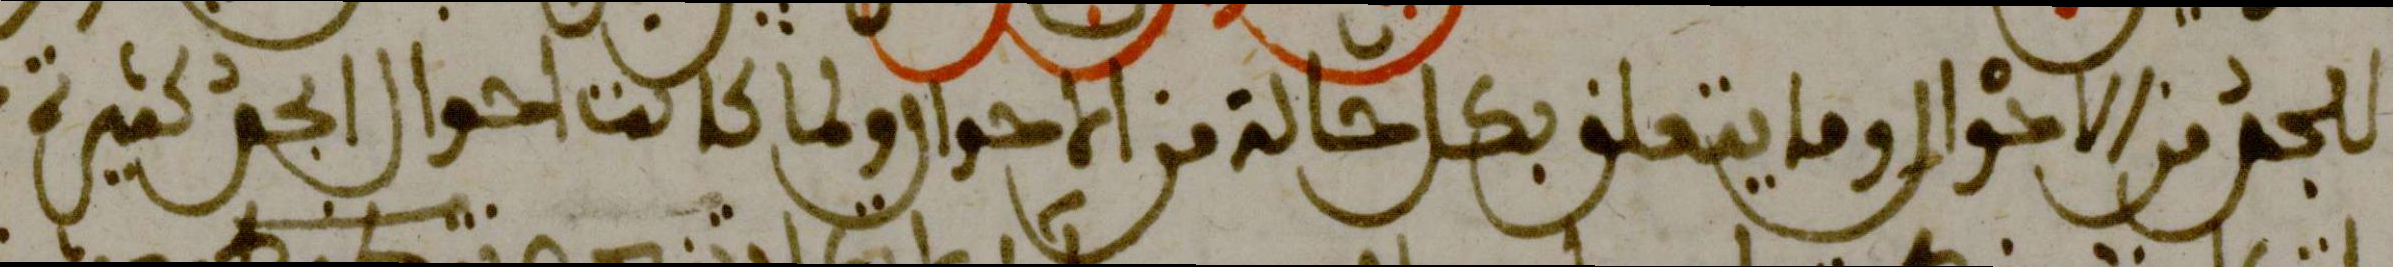للجد من الاحْوال وما يتعلق بكل حالة من الاحوال ولما كانت احوال الجد كثيرة
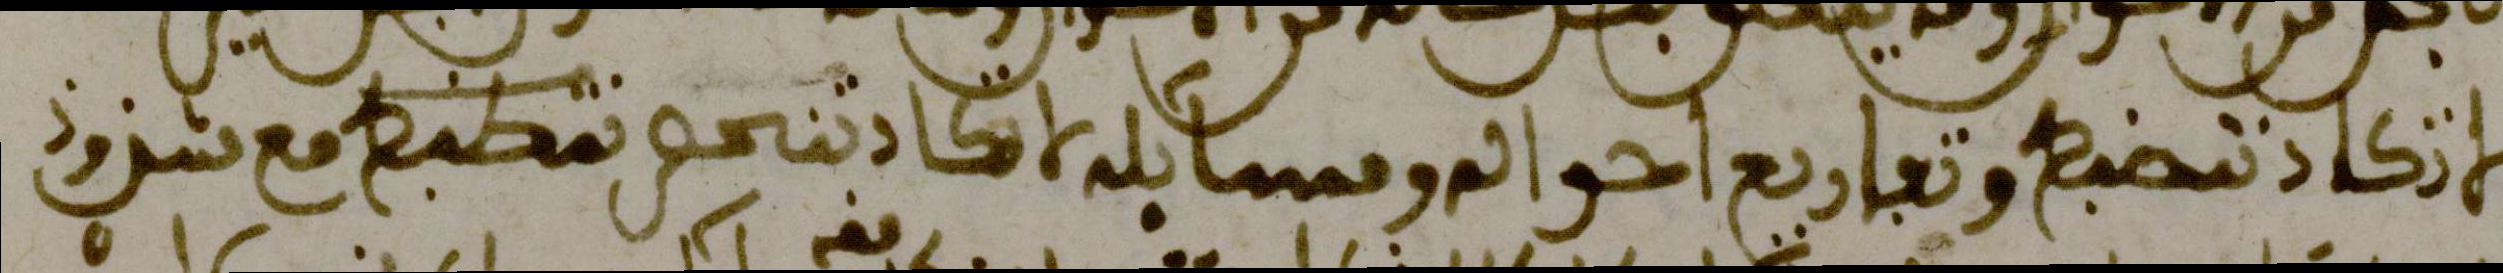لا تكاد تنضبط وتفاريع احواله ومسائله لا تكاد تنحصر نتظبط مع شذوذ
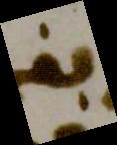فقه
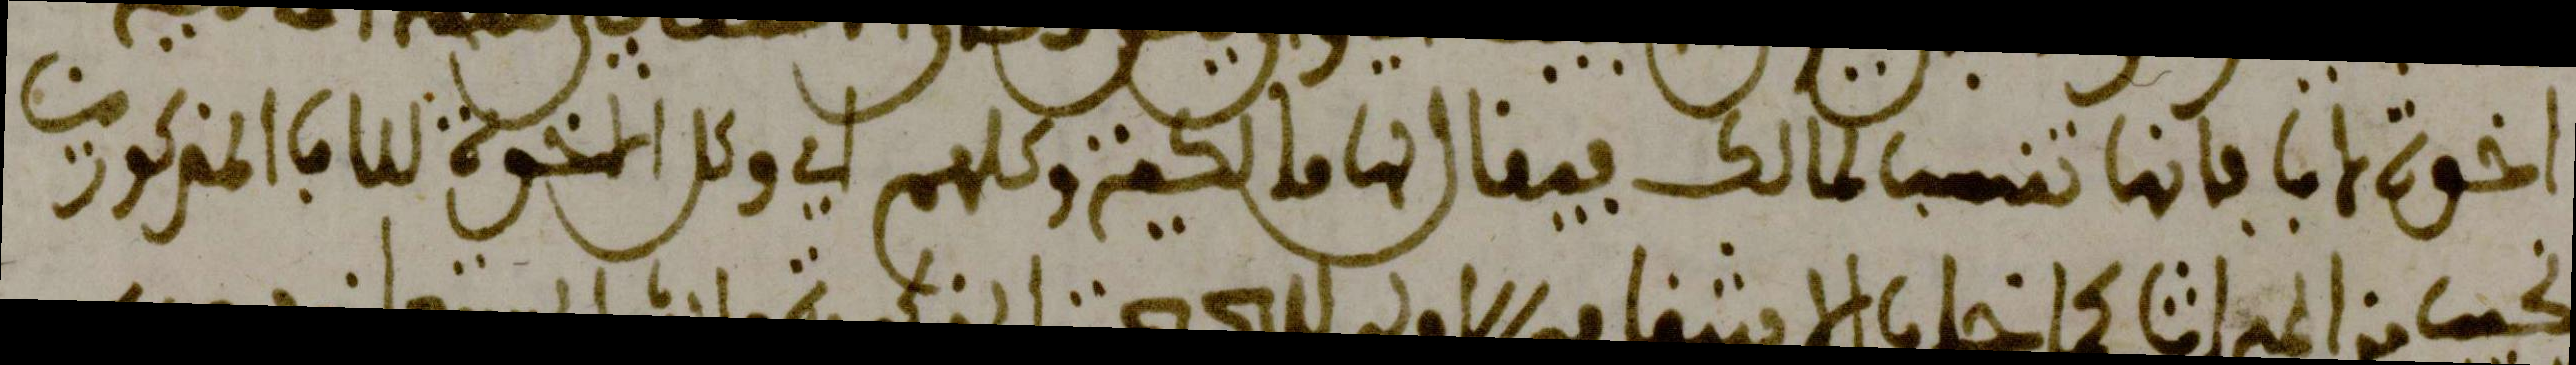اخوة لاب فانها تنسب لمالك فيقال لها مالكية وكلهم اي وكل الاخوة للاب المذكورين
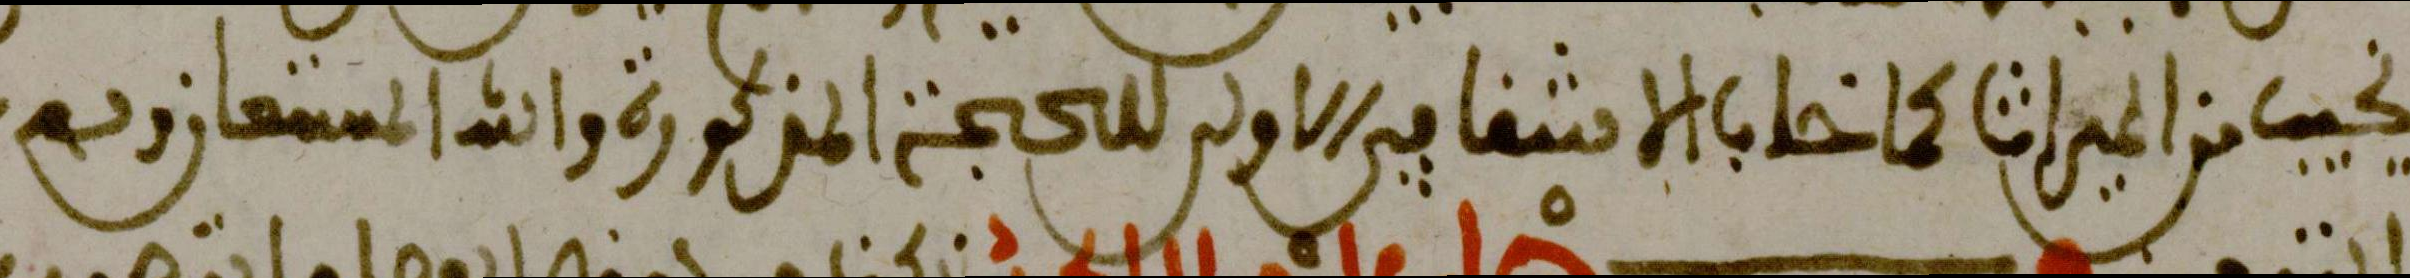يخيب من الميراث كما خاب الاشقا في الاولى للحجة المذكورة والله المستعان وبه
